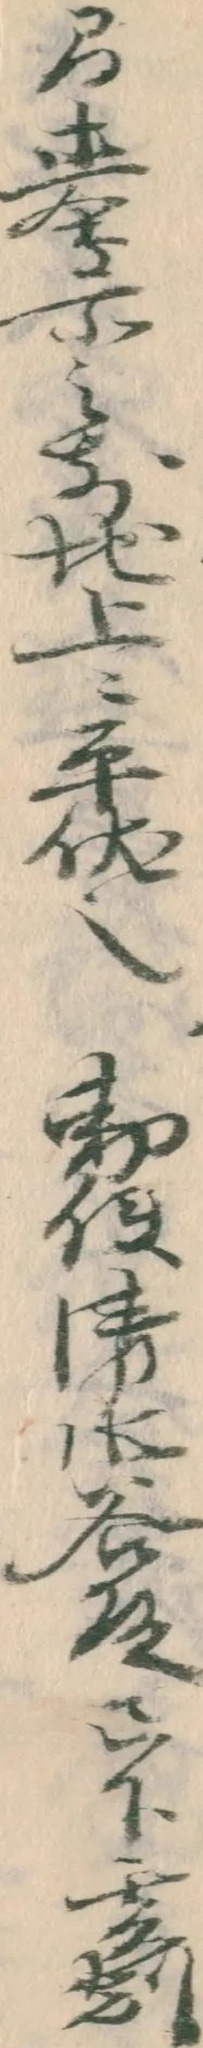間直會所之前地上ニ平伏也勅使清水谷殿已下亥刻
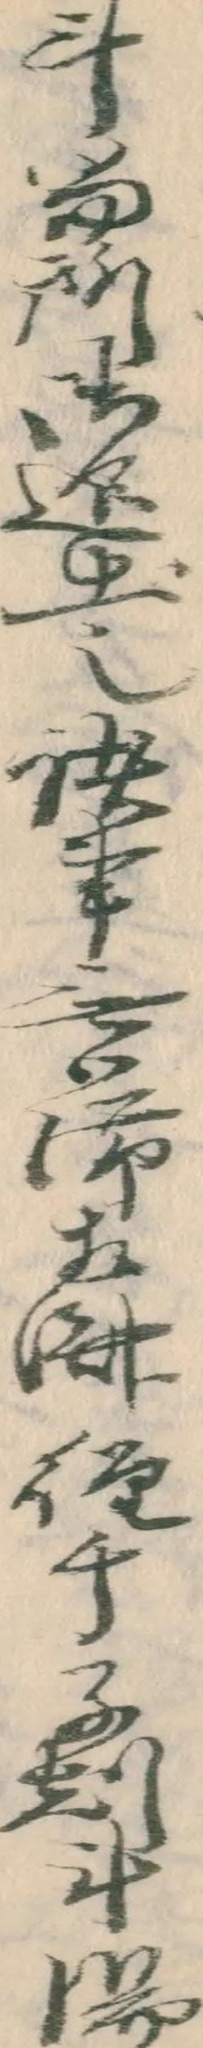斗當所御退出也諸事無御滞相済経千子刻斗湯
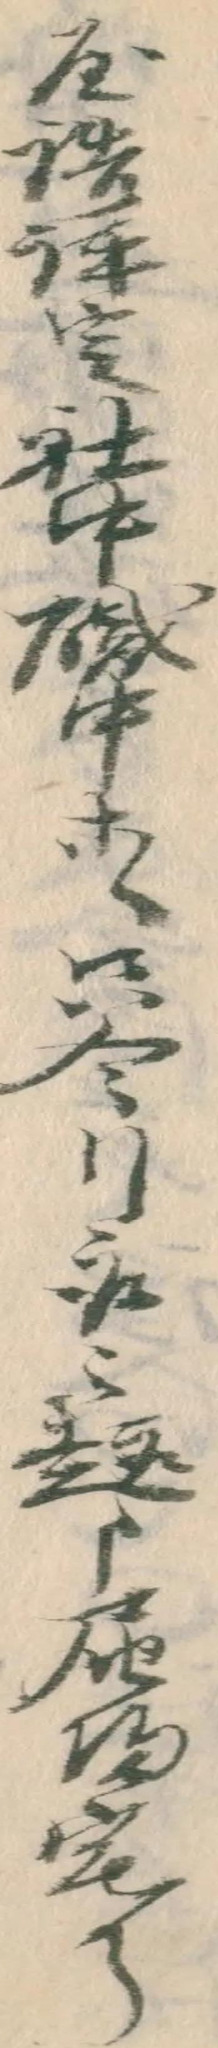屋詰評定社中職中等へ只今引取被申届帰宅了
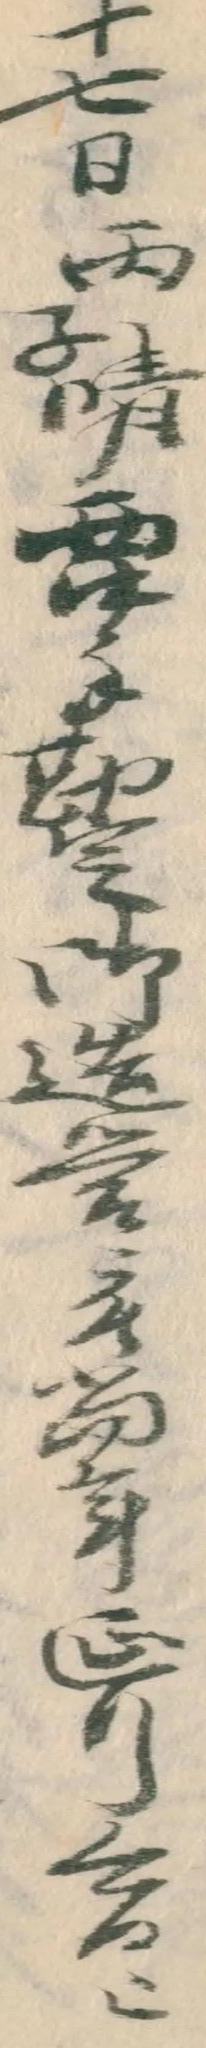十七日丙子晴西中手勘定御造営ニ而當年延引今日被
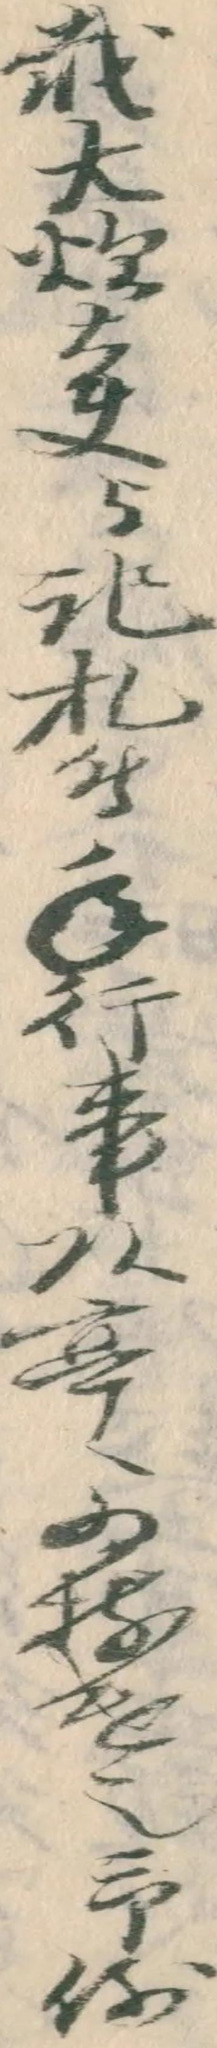蔵大炊大夫と記札付年行事頭亭へ為持遣之予例
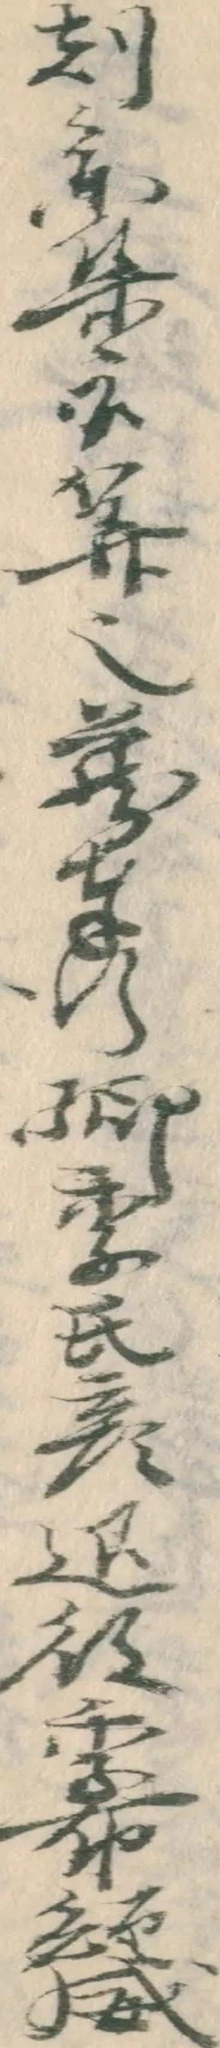刻参集取算也蔵奉行卿季氏彦退役季布経威
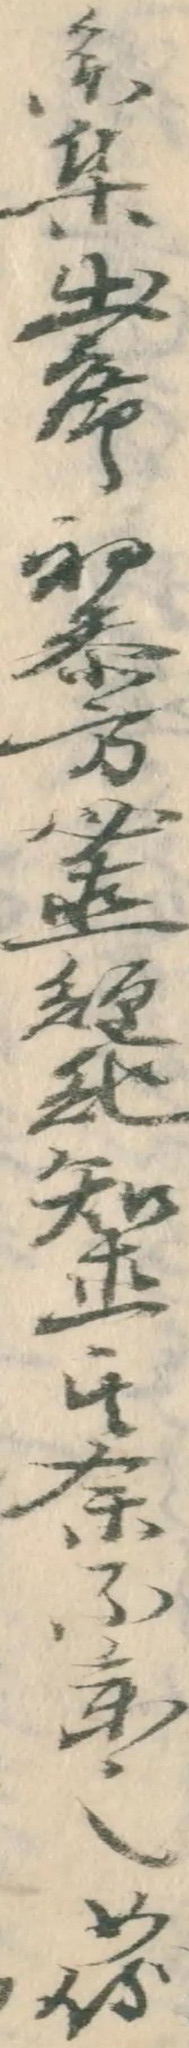参集出席参方必直経紀知直其余不参也如例
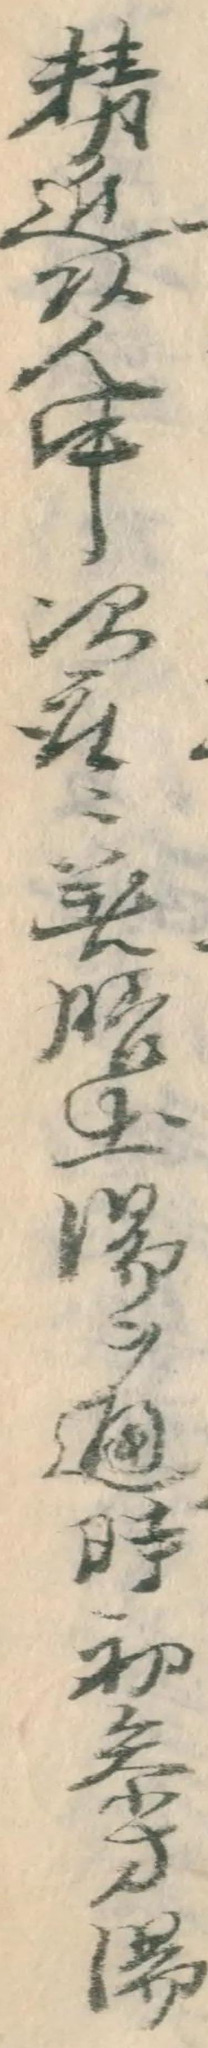精進頭人中次座に着胎出湯ヲ通時初参方湯

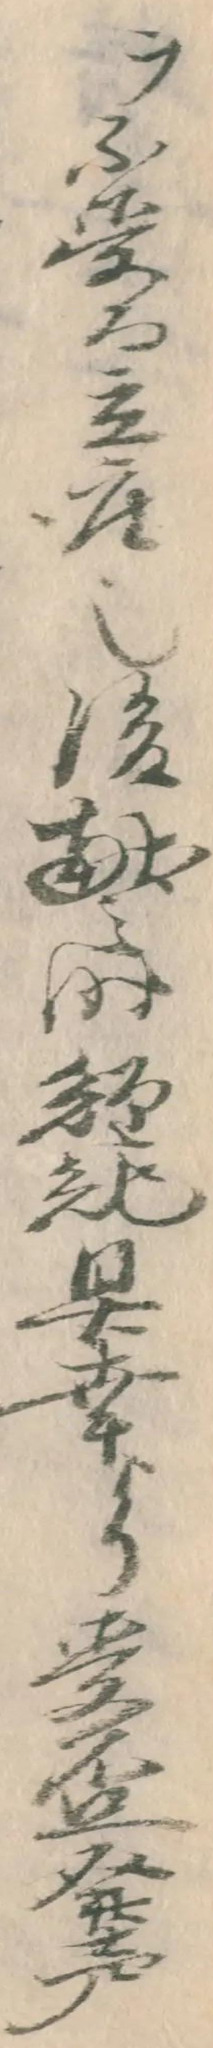ヲ不受而立座也後献之時経紀具幸より受盃発声
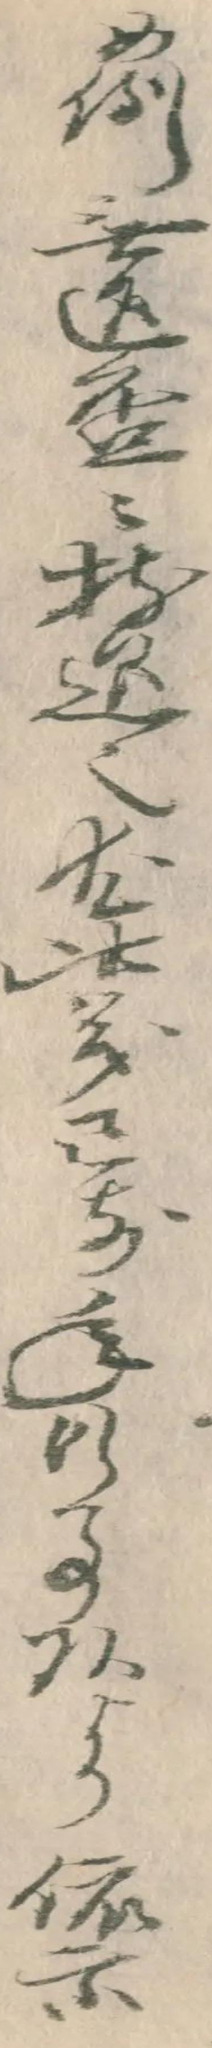如例無退盃々持退也尤此義已前年行事頭より依示
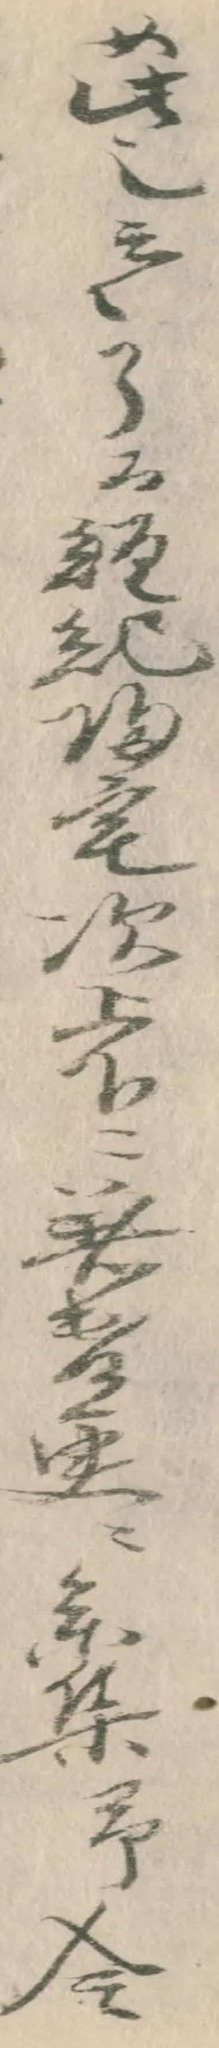如此之云々了而経紀帰宅次上下ニ着替更ニ参集予令
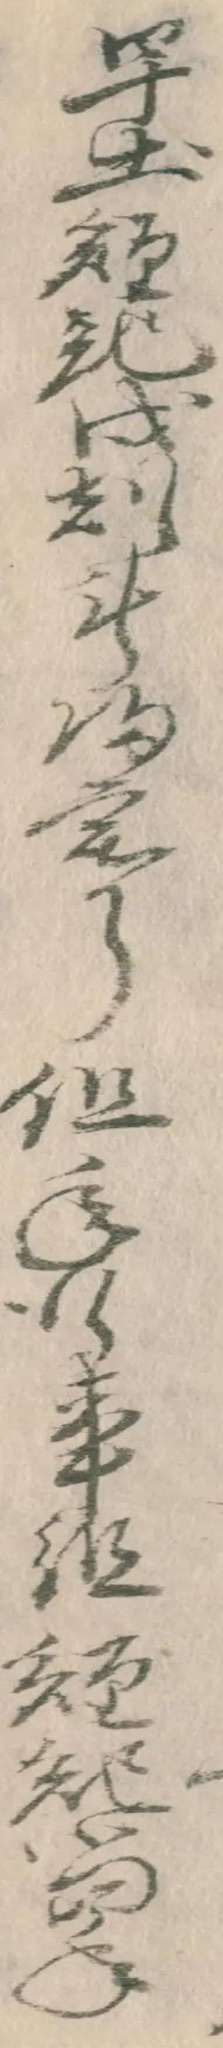早出経紀戌刻斗帰宅了但年行事但経紀當年
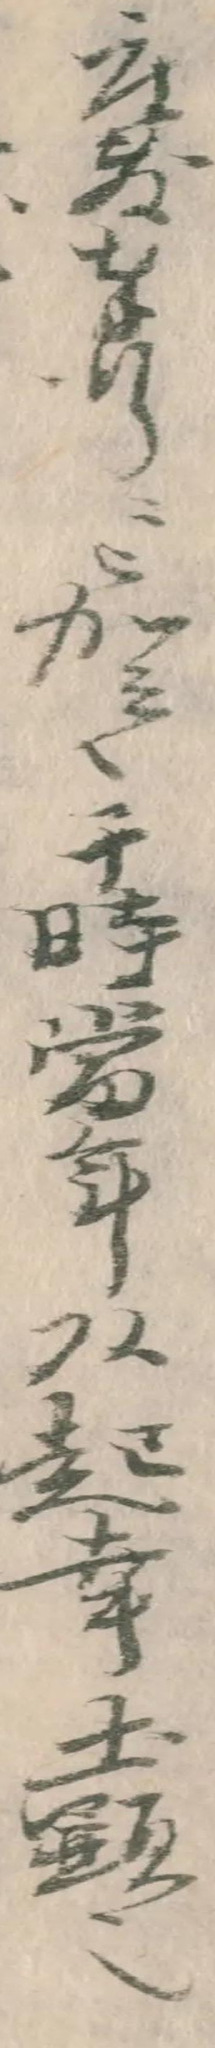座敷奉行ニ被加云々于時當年頭起幸土顕也
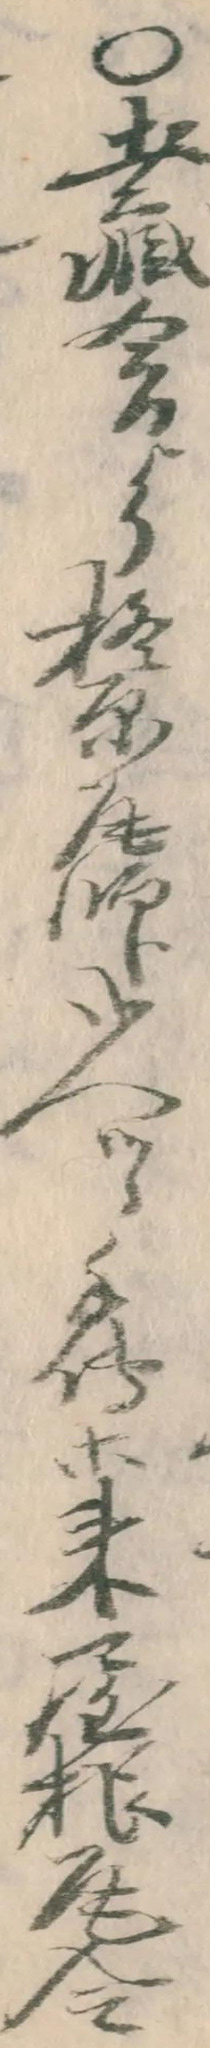○土蔵倉より柊原瓦師弐人ツヽ手伝等来屋根瓦共
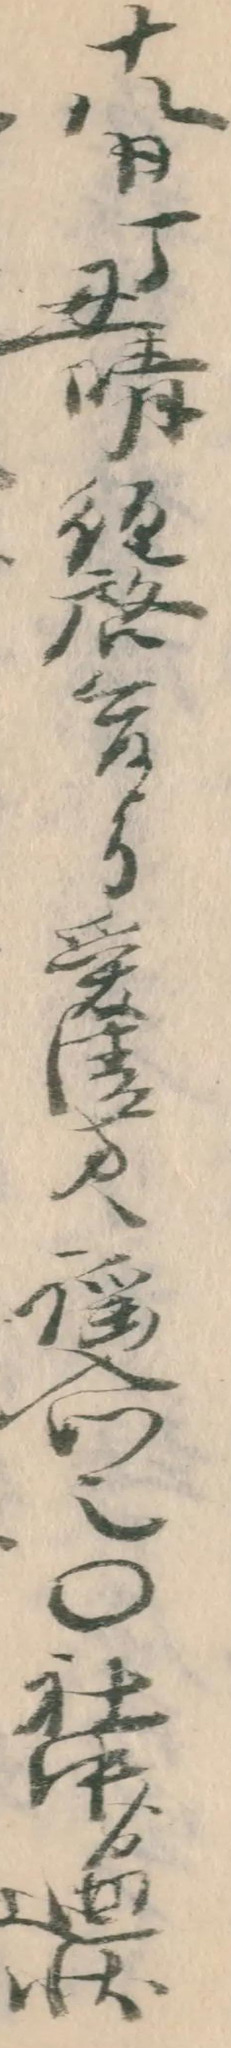十八日丁丑晴経啓今日より愛清方へ謡入門也○社中ゟ廻状
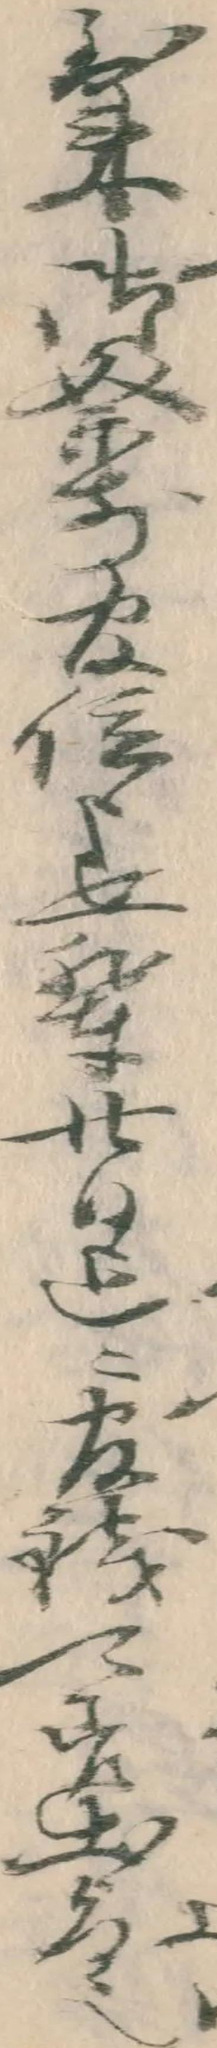到来御祭前官位申上輩廿日迄に官銭可差出旨也
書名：賀茂社記録. 第67冊
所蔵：国立国会図書館 National Diet Library, JAPAN
